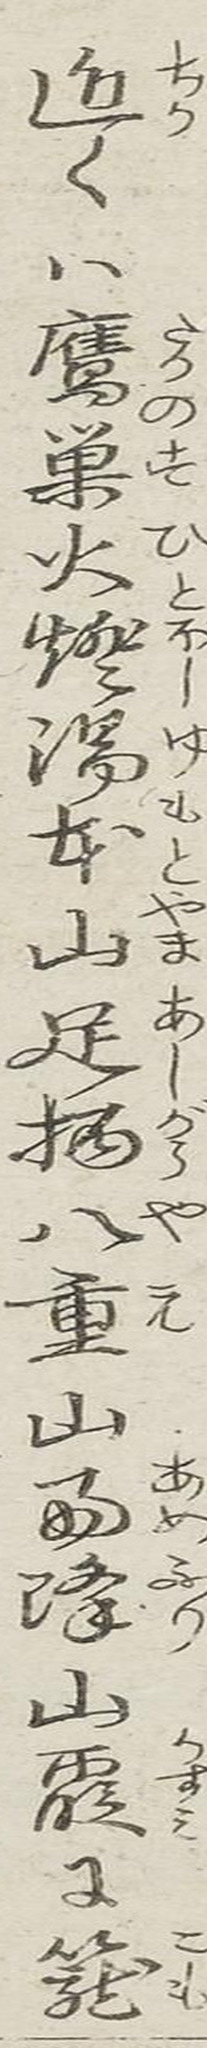近くは鷹巣火燈湯本山足柄八重山雨降山霞に籠
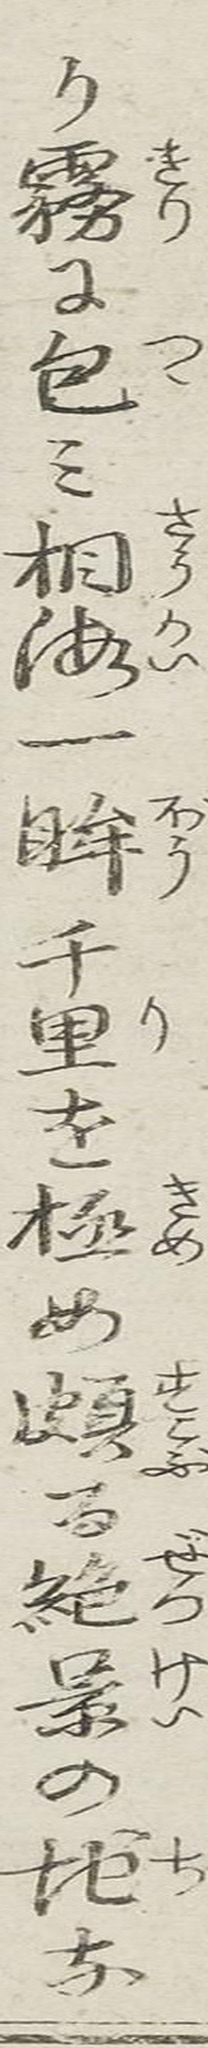り霧に包み相海一眸千里を極め頗る絶景の地な
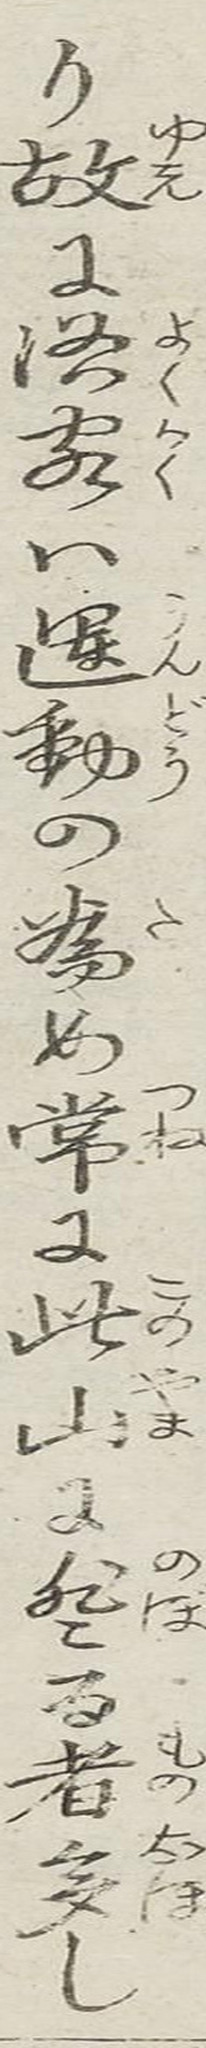り故に浴客は運動の為め常に此山に登る者多し
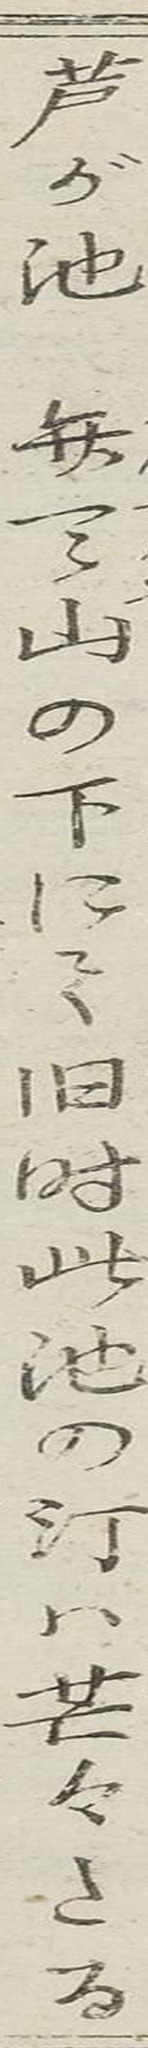芦が池弁天山の下にて旧時此池の汀は芒々たる
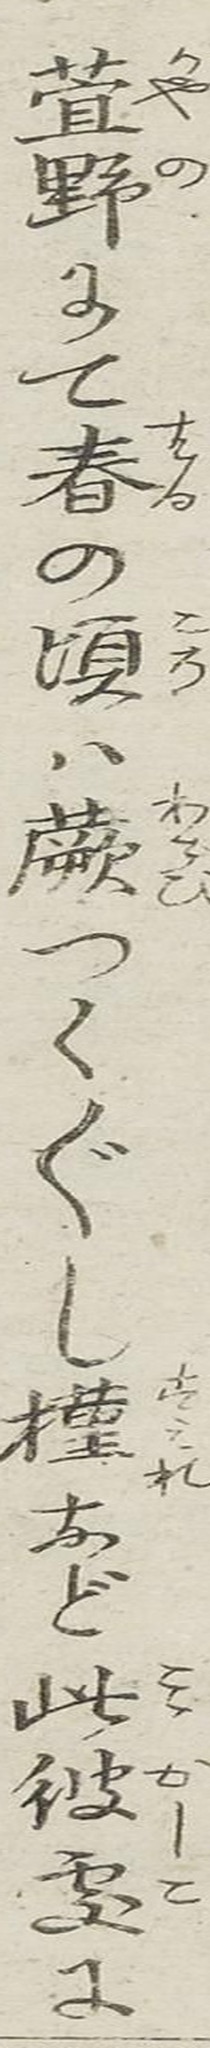萱野にて春の頃は蕨つく〴〵し槿など此彼處に
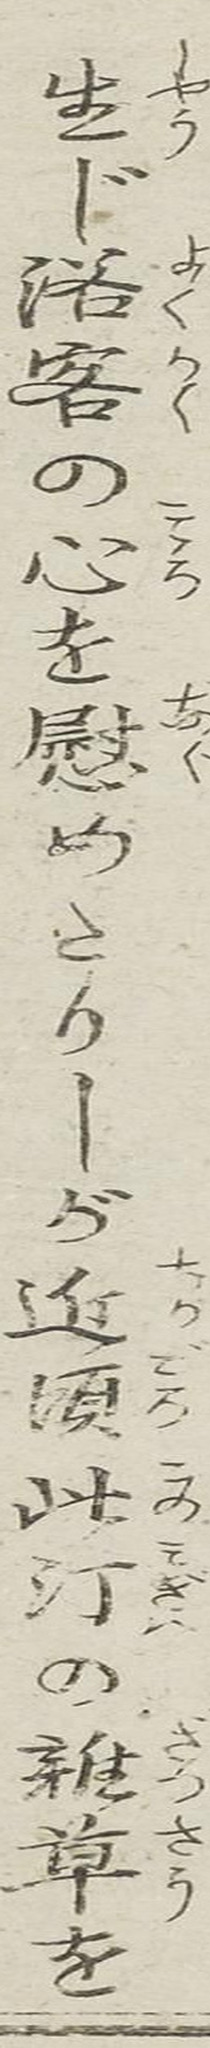生じ浴客の心を慰めたりしが近頃此汀の雑草を
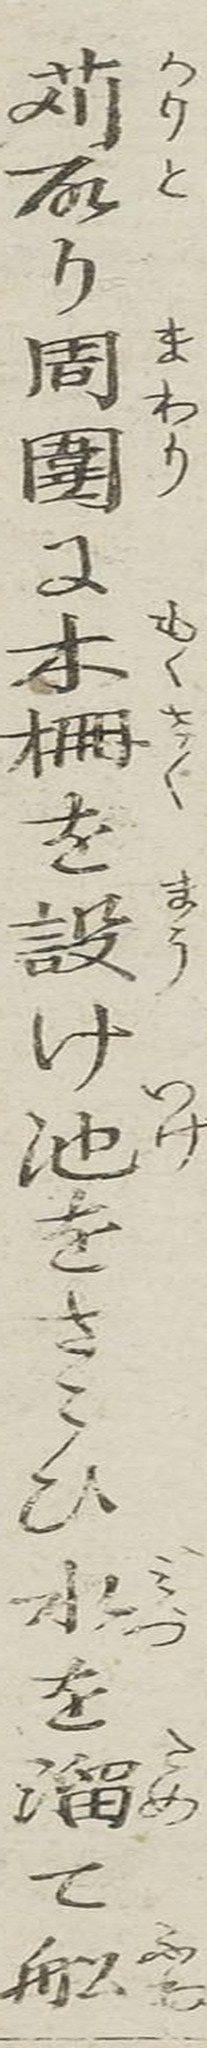苅取り周囲に木柵を設け池をさらひ水を溜て船

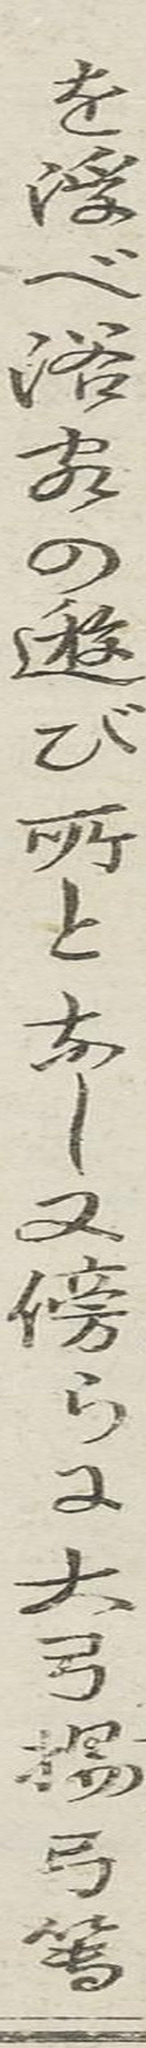を浮べ浴客の遊び所となし又傍らに大弓楊弓等
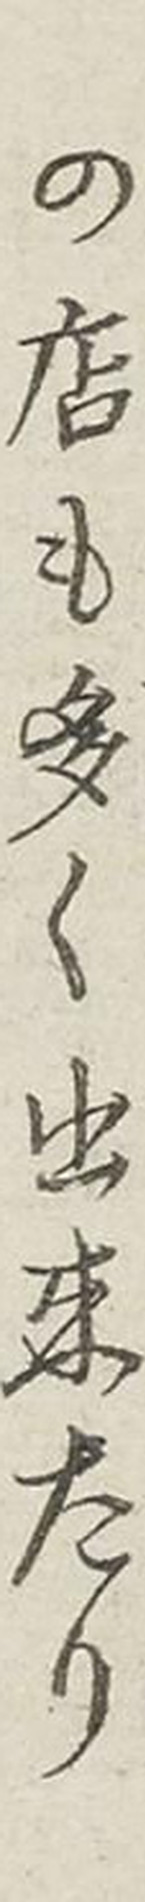の店も多く出来たり
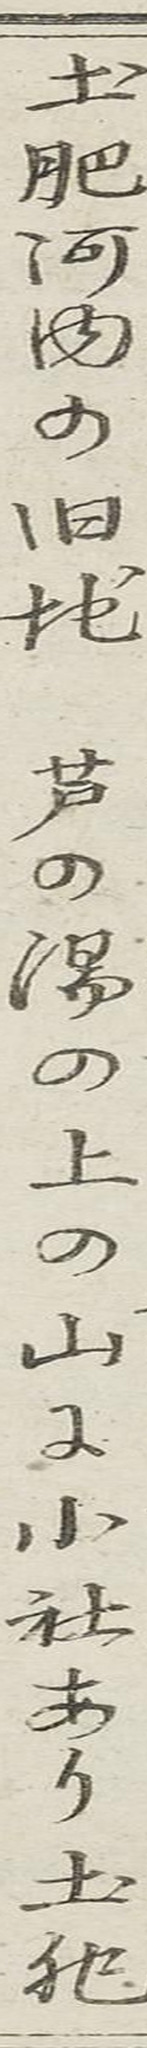土肥河内の旧地芦の湯の上の山に小社あり土肥
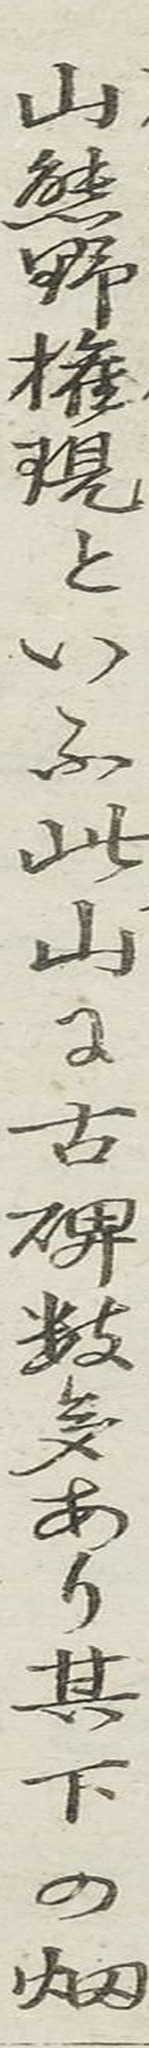山熊野権現といふ此山に古碑数多あり其下の畑
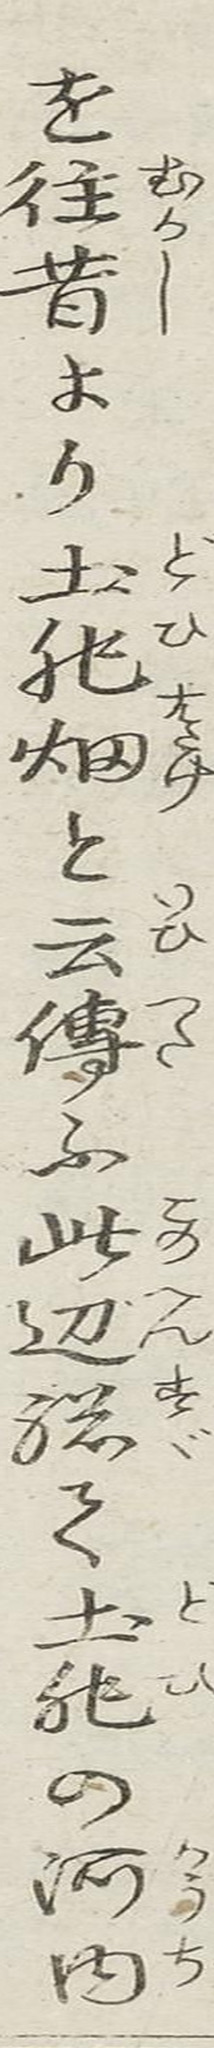を往昔より土肥畑と云伝ふ此辺諸て土肥の河内
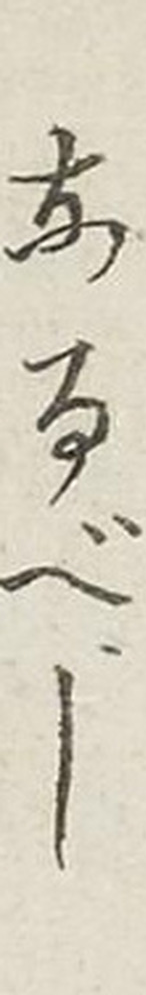なるべし
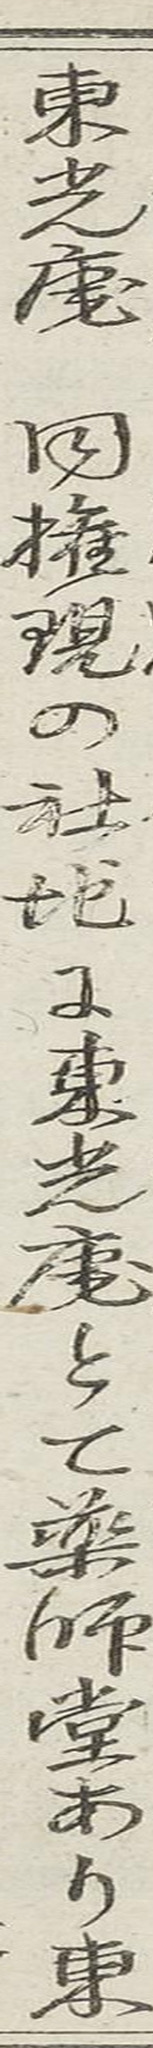東光庵同権現の社地に東光庵とて薬師堂あり東
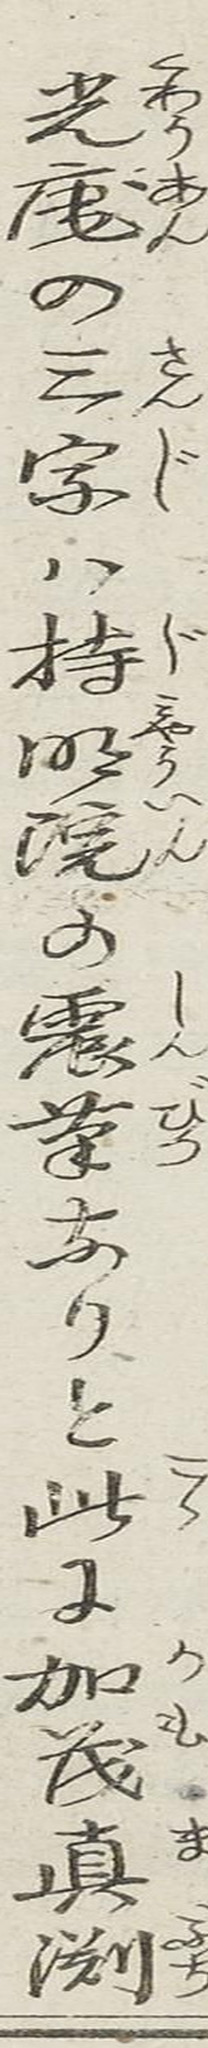光庵の三字は持明院の震筆なりと此に加茂真渕
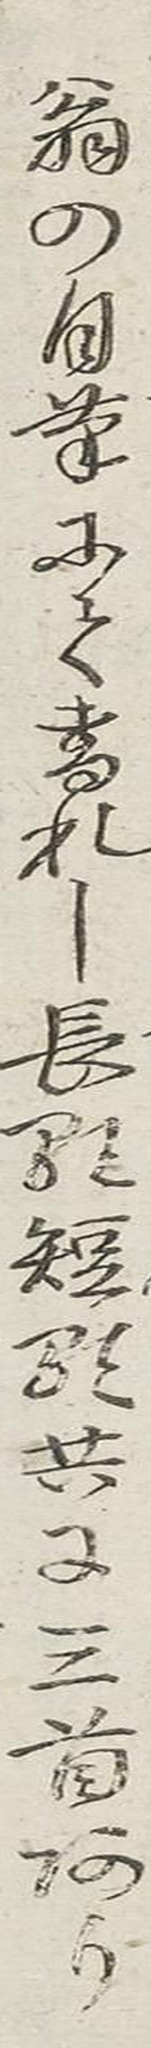翁の自筆にて書れし長歌短歌共に三首あり
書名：箱根温泉誌　全
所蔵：東京大学地震研究所図書室 Earthquake Research Institute Library, The University of Tokyo, JAPAN
